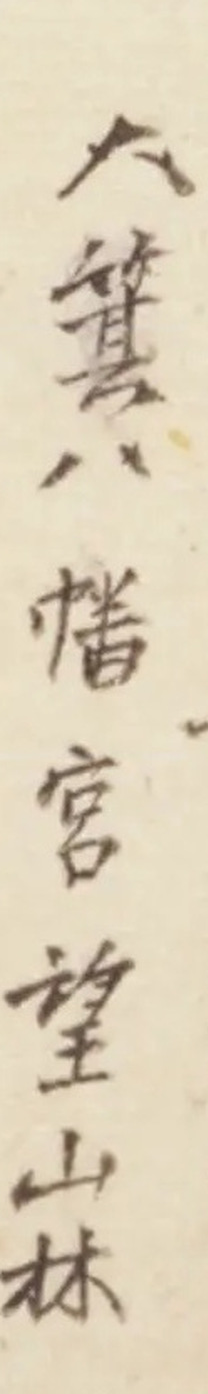大箕八幡宮望山林
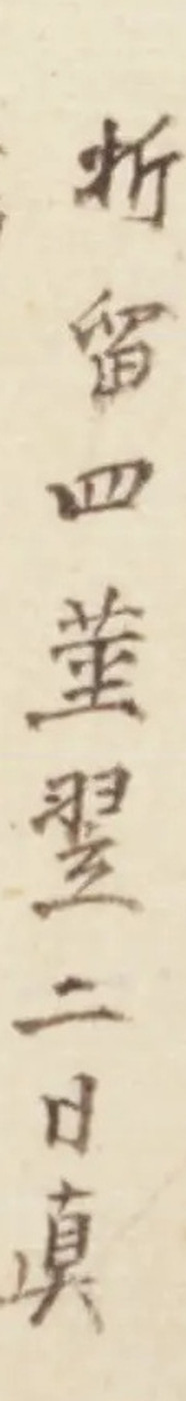折留四茎翌二日真
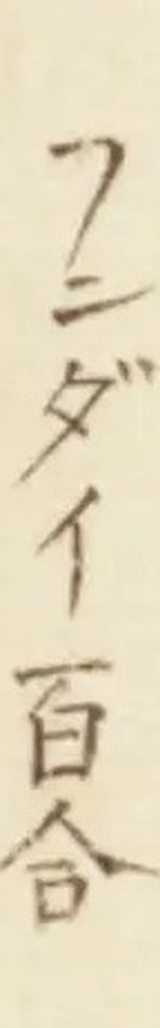フンダイ百合
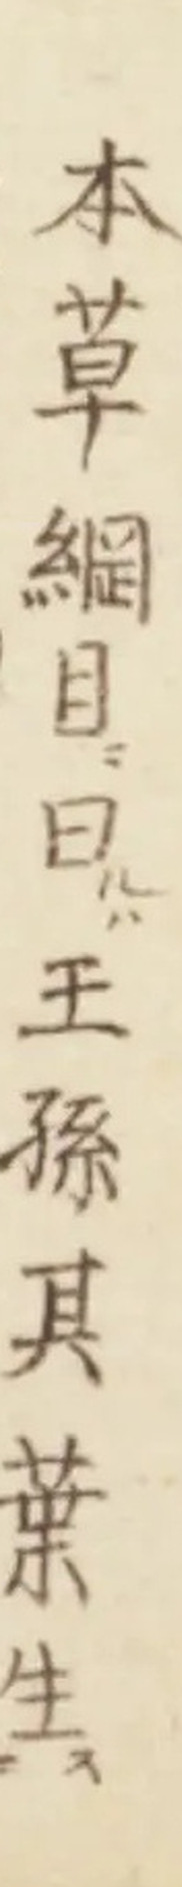本草綱目ニ曰ルハ王孫其葉生ス
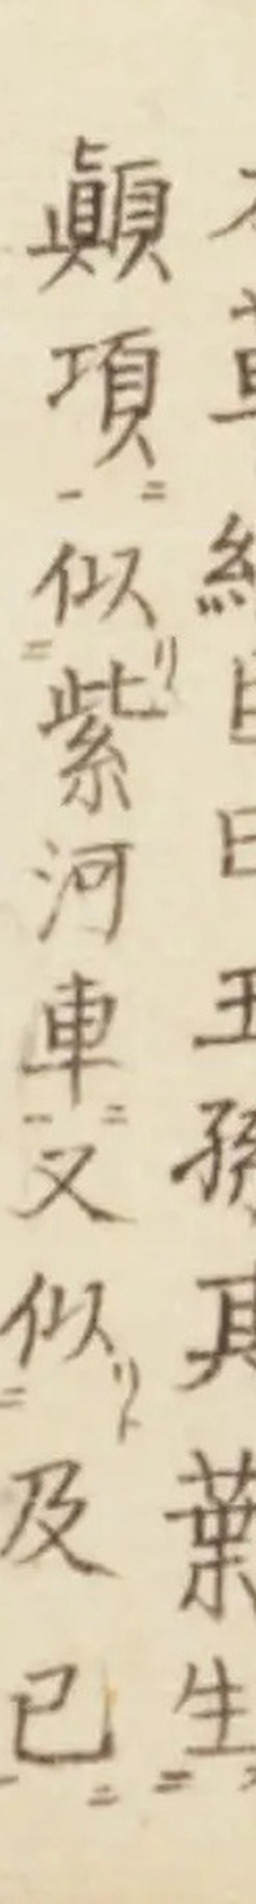顚項ニ似リ紫河車ニ又似リト及已ニ
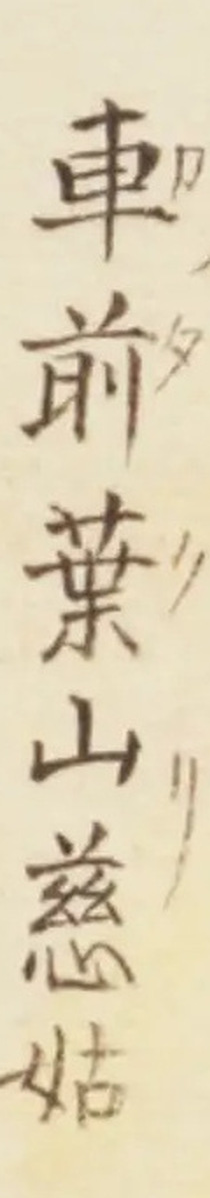車前葉山慈姑
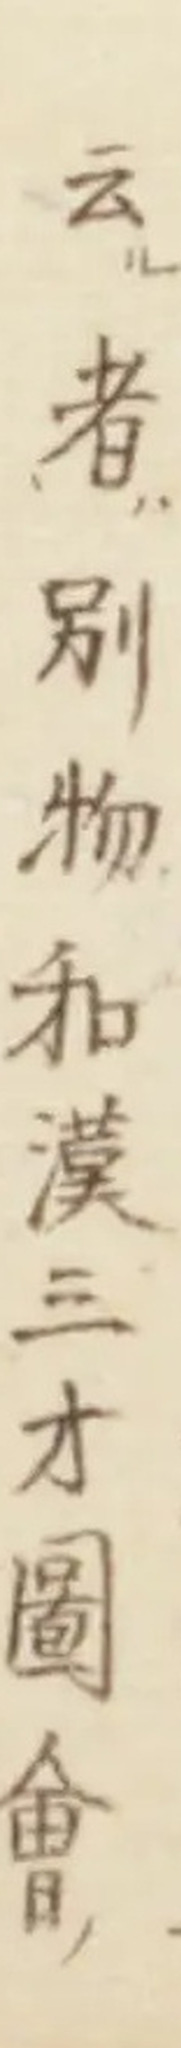云ル者ハ別物和漢三才圖會ノ
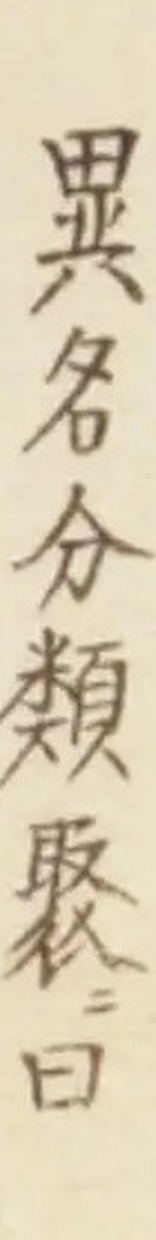異名分類聚に曰
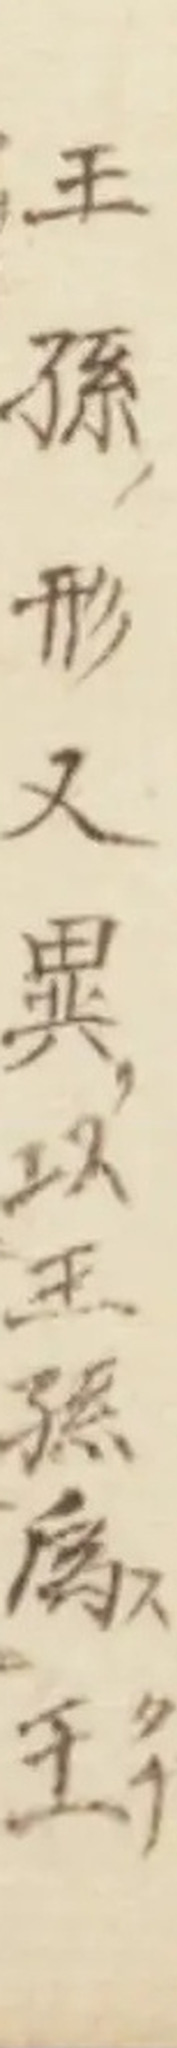王孫ノ形又異リ以王孫爲ス王
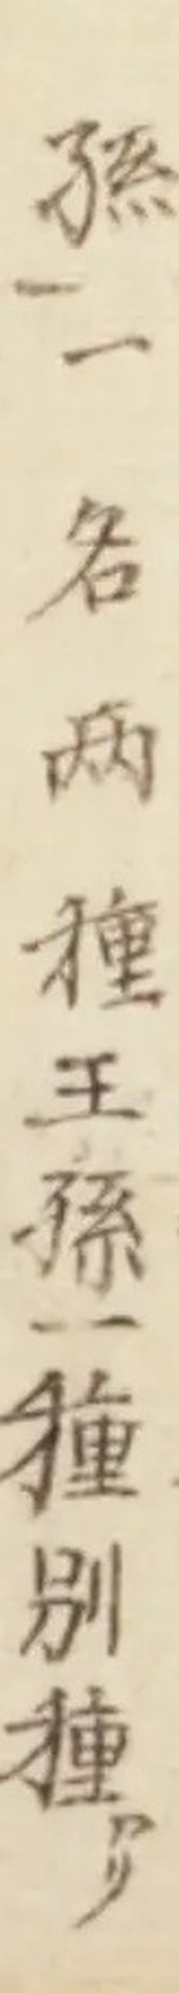孫一名両種王孫一種別種
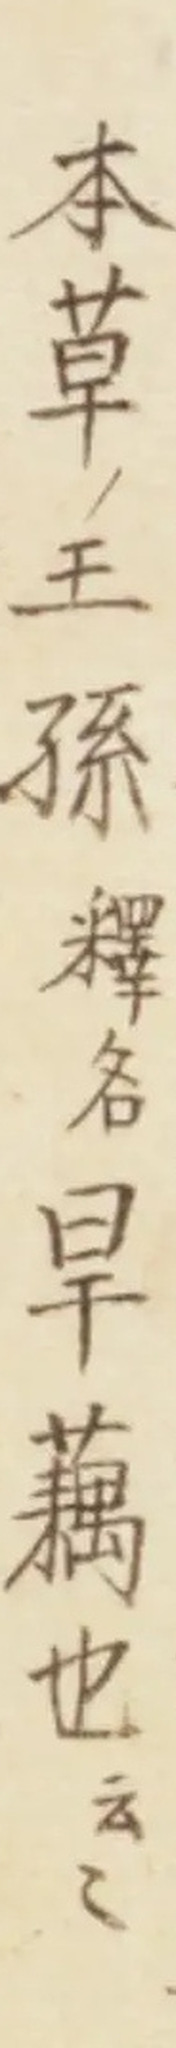本草ノ王孫釋名旱藕也云々
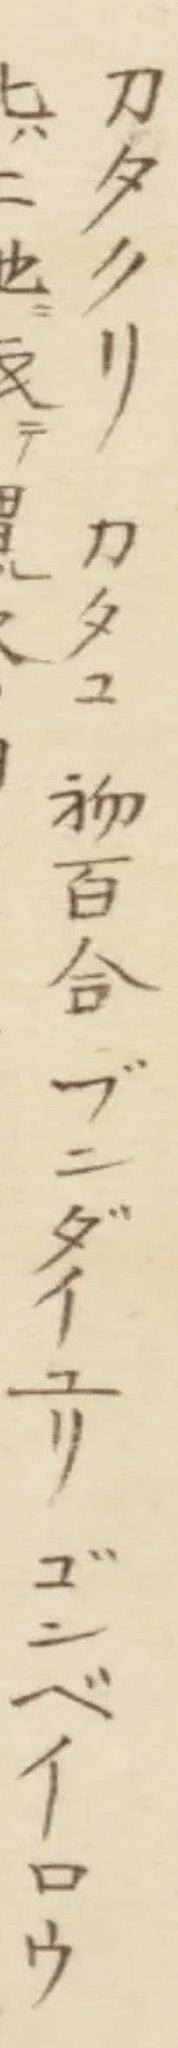カタクリカタコ初百合ブンダイユリゴンベイロウ
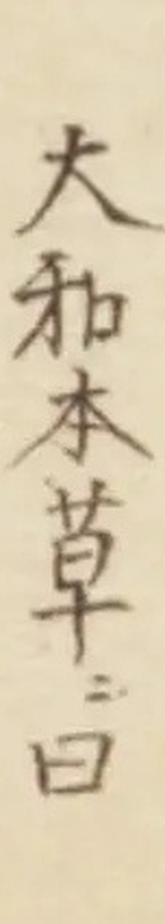大和本草曰
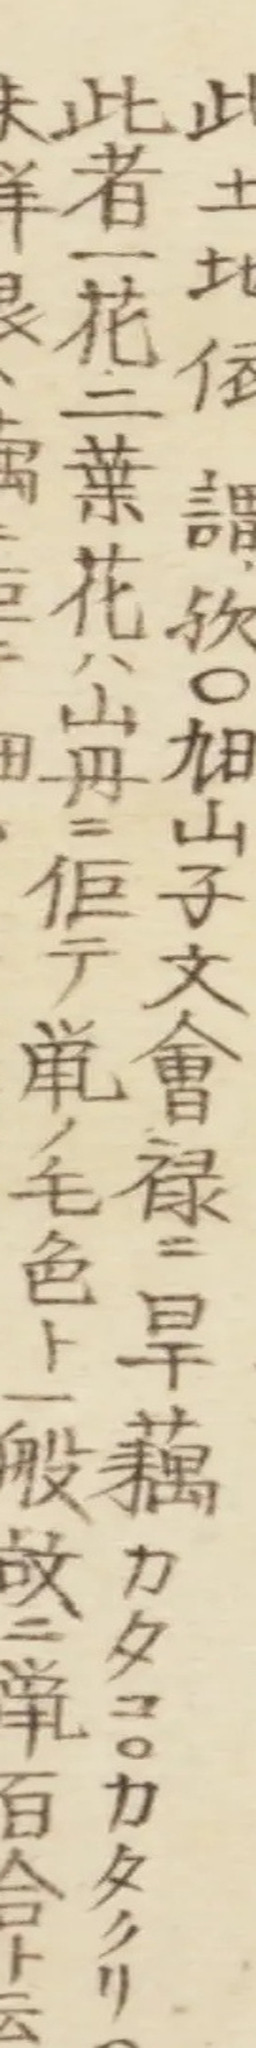此者一花二花ハ山丹ニ佀テノ毛色ト一般故ニ其余名義
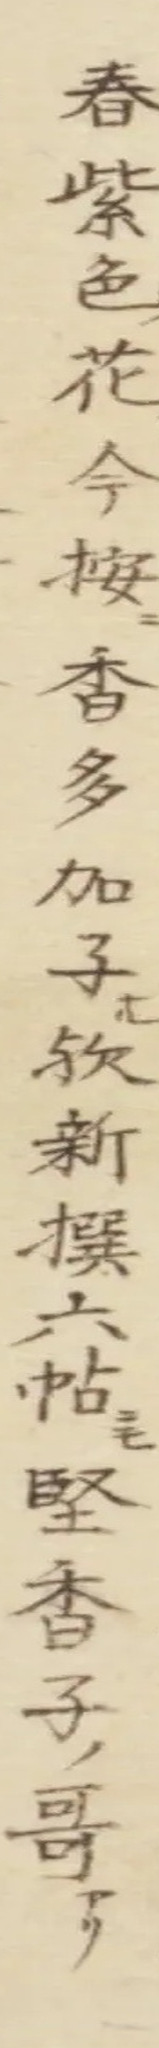春紫色花サク今按ニ香多加子ナル欤新撰六帖ニモ堅香子ノ哥アリ
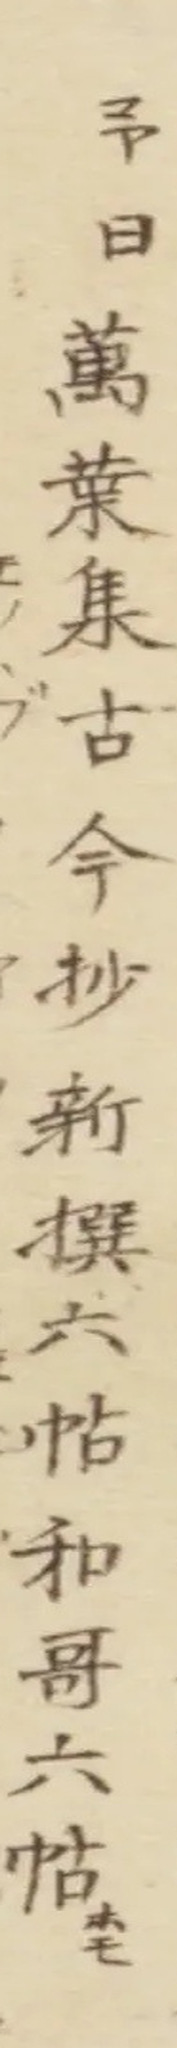予曰万葉集古今抄新撰六帖和哥六帖
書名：梅園草木花譜春之部. 3
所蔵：国立国会図書館 National Diet Library, JAPAN
